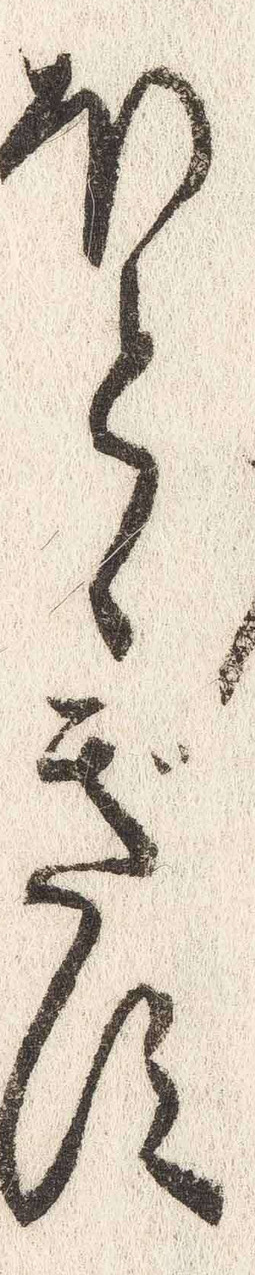ほとゝぎす
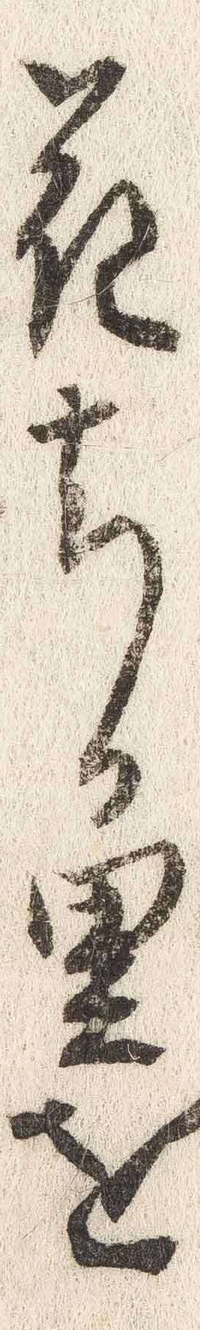花ちる里を
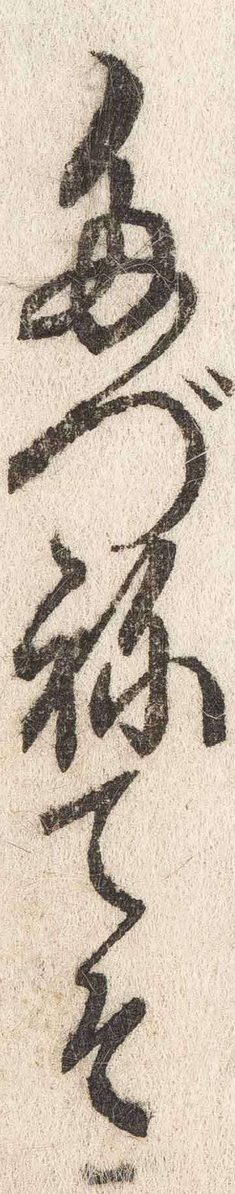たづねてそ

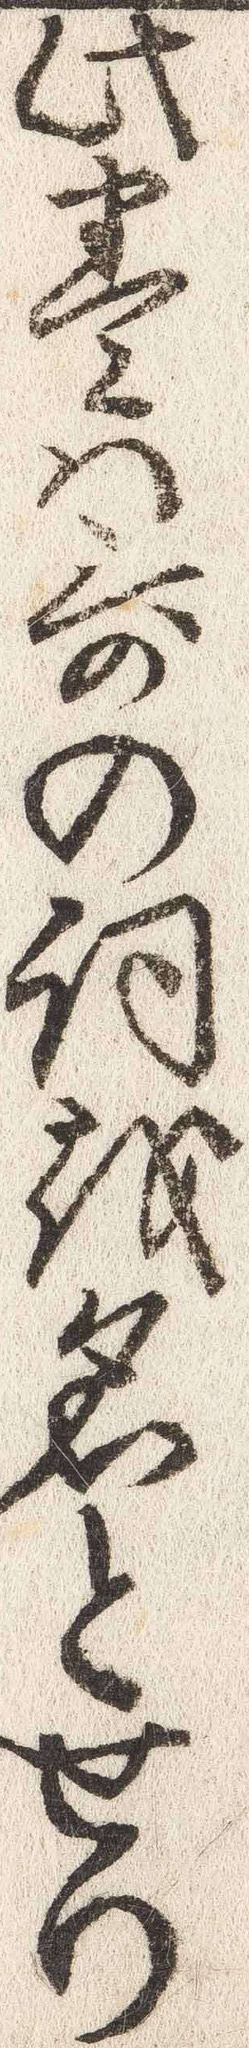此巻は歌の詞を名とせり
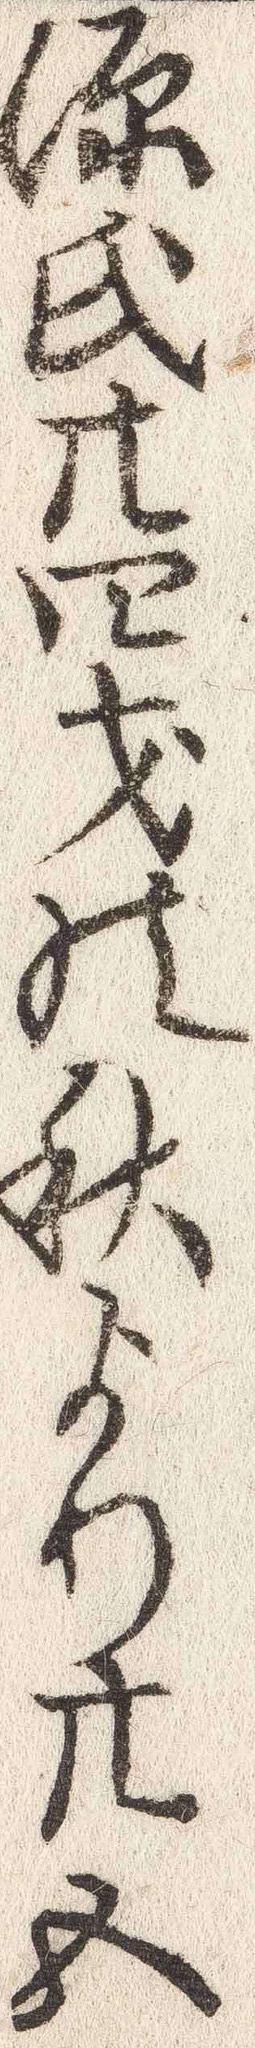源氏廿四才の秋より廿五
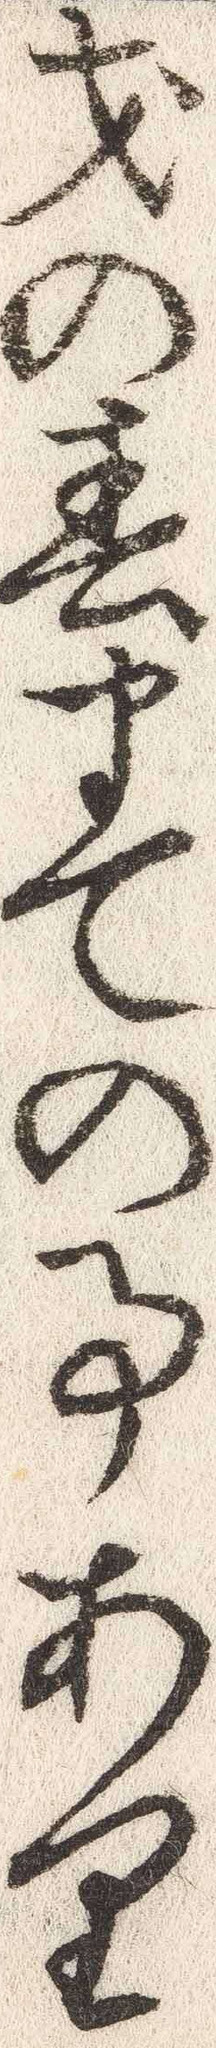才の春まての事あり
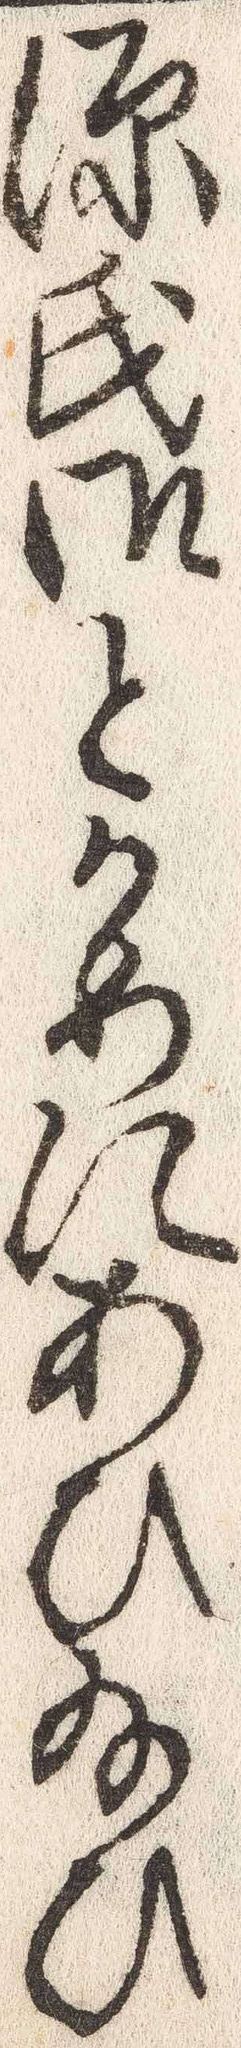源氏御とかめにあひ給ひ
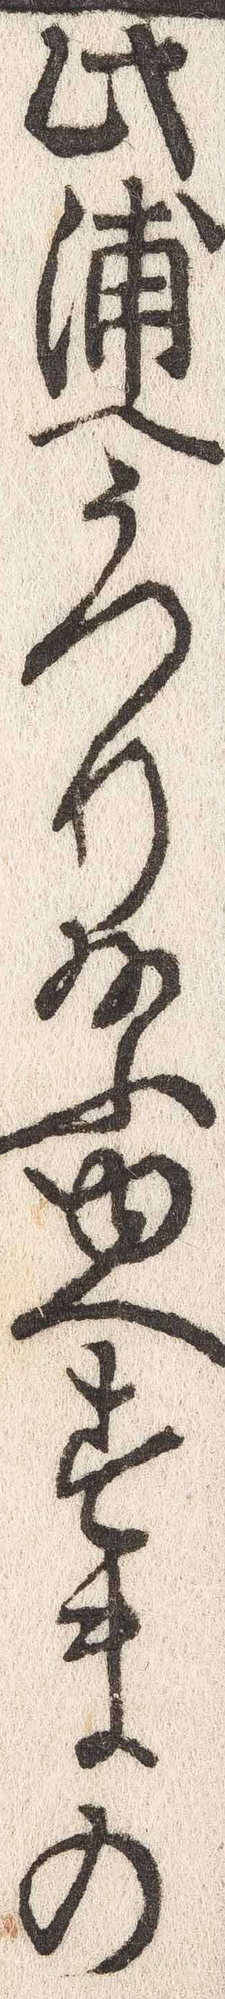此浦へうつり給ふゆへすまの
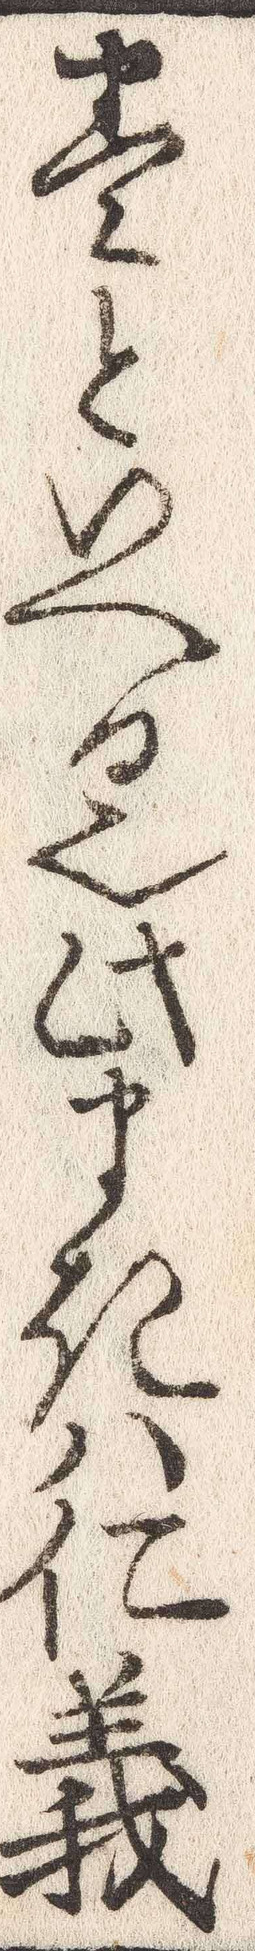巻といへる也此まきは仁義
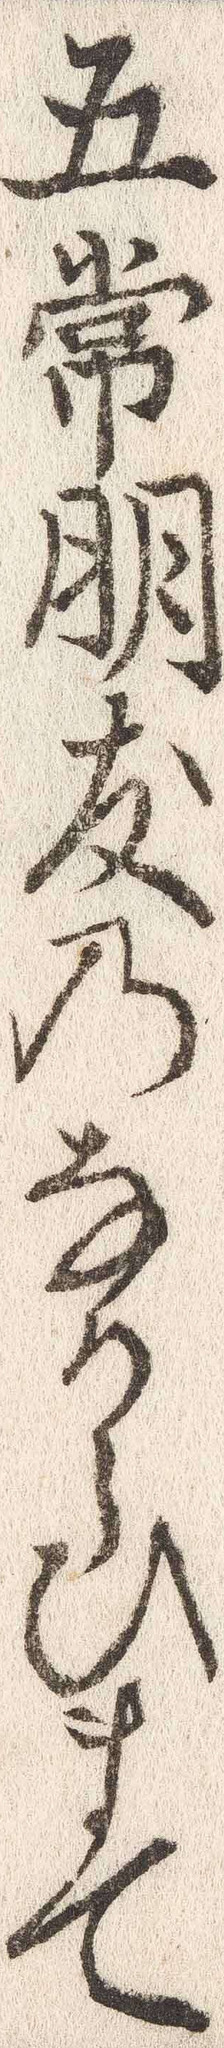五常朋友のなからひまて
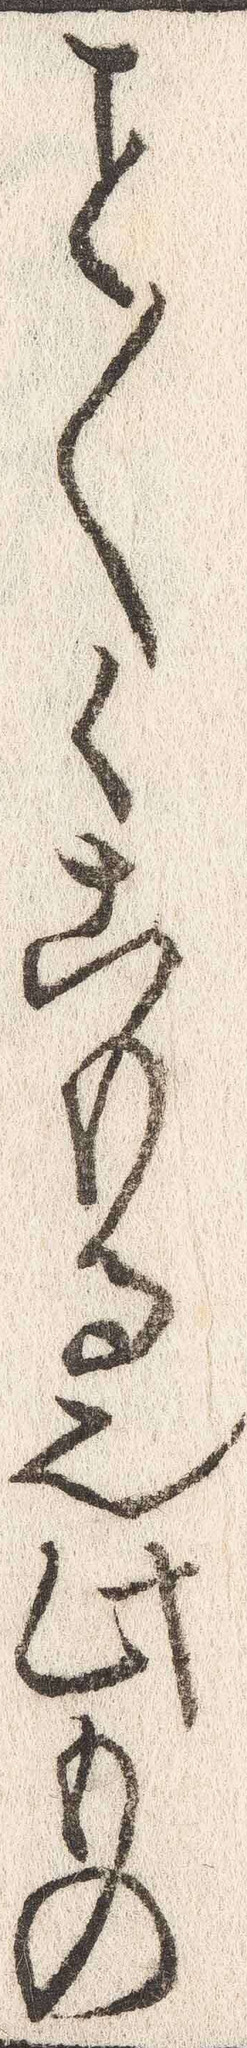こと〳〵くこもる也此もの
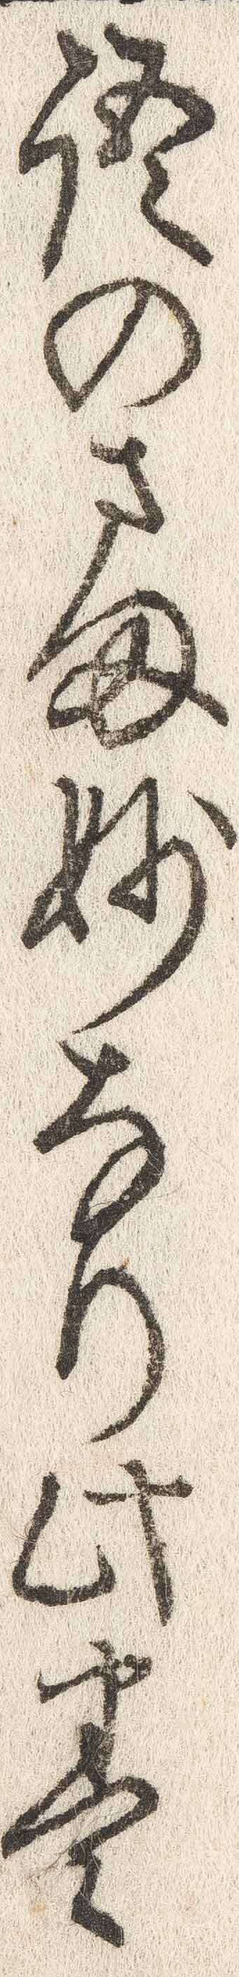語のさま妙なり此巻

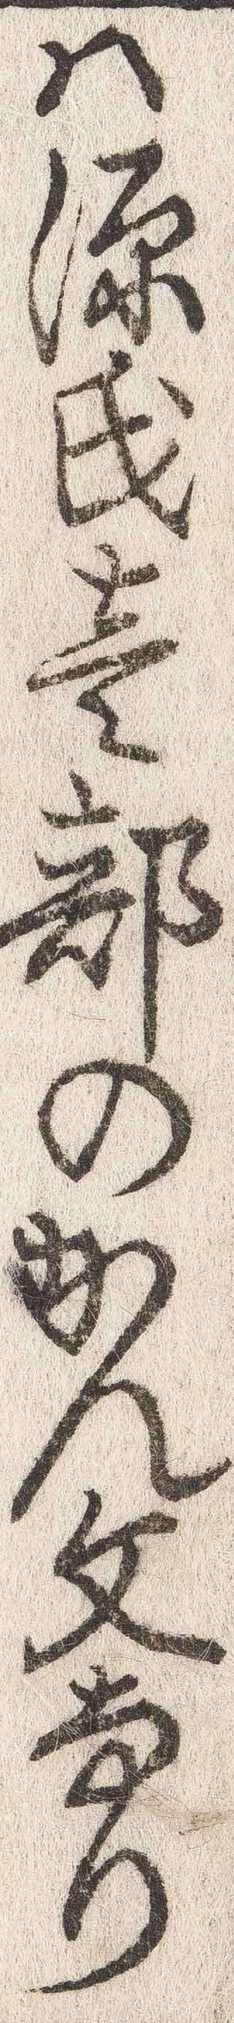は源氏壱部のかん文なり
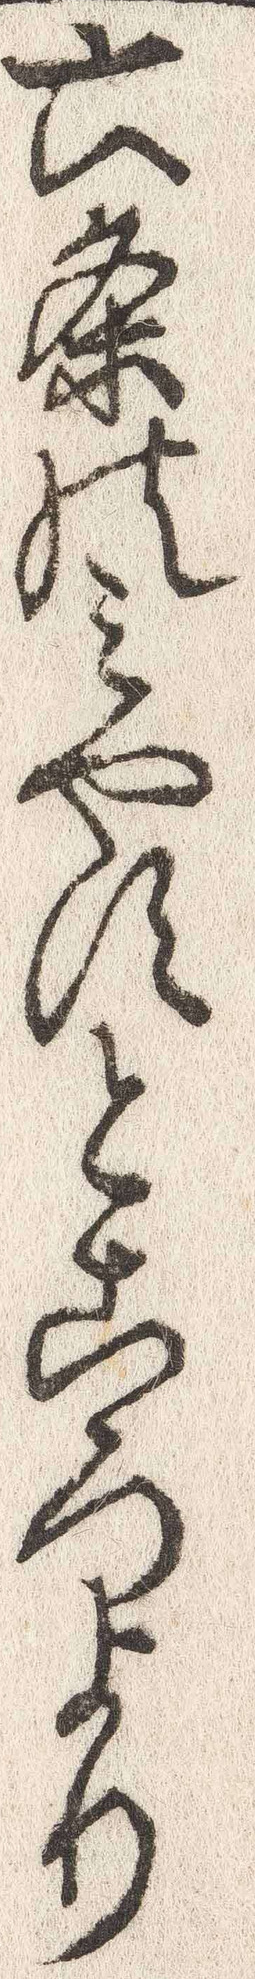六条のみやすところより
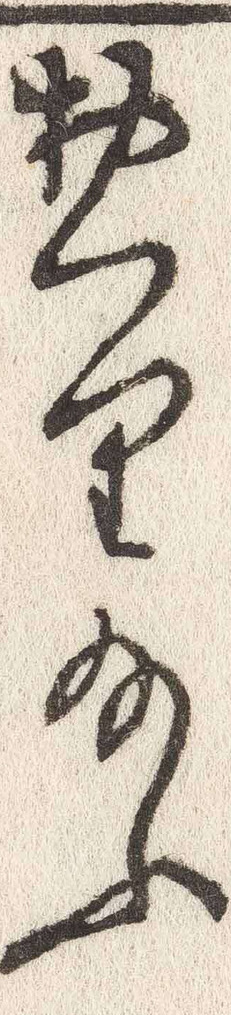おくり給ふ
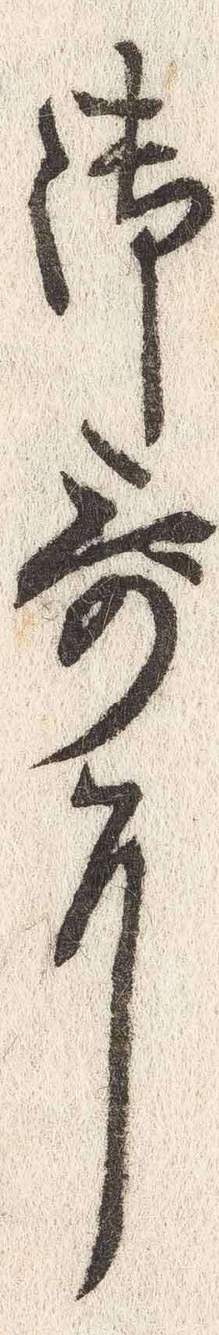御歌に
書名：源氏物語
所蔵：東京学芸大学附属図書館 国文学研究資料館
